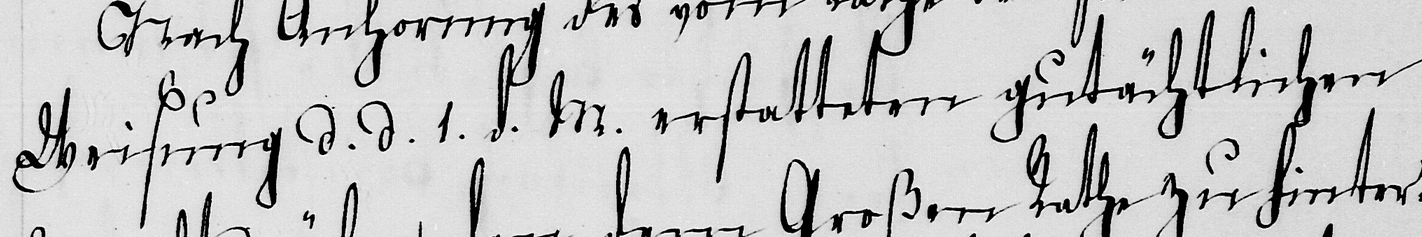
Weisung d. d. 1. d. M. erstatteten gutächtlichen
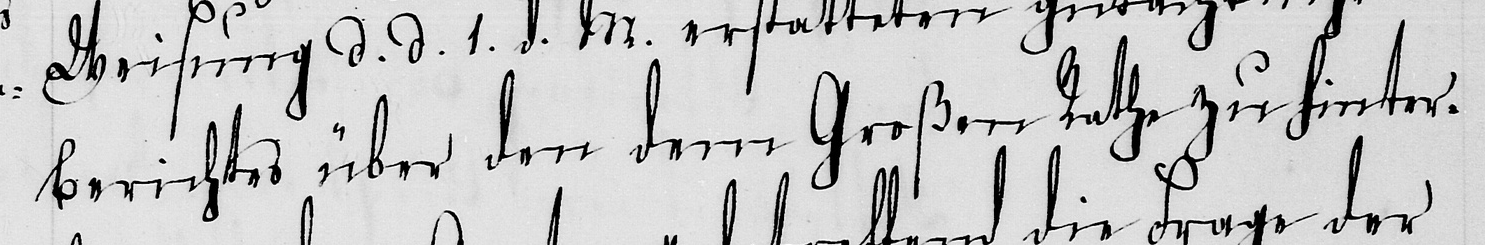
Berichtes über den dem Großen Rath zu hinter¬
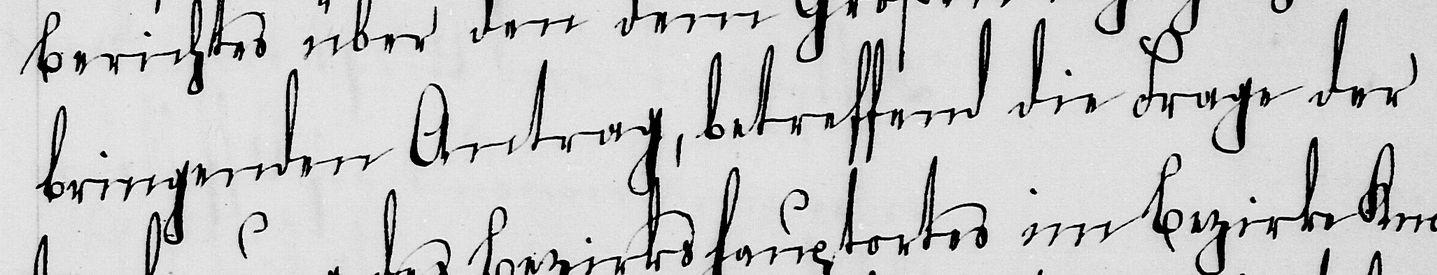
bringenden Antrag, betreffend die Frage der
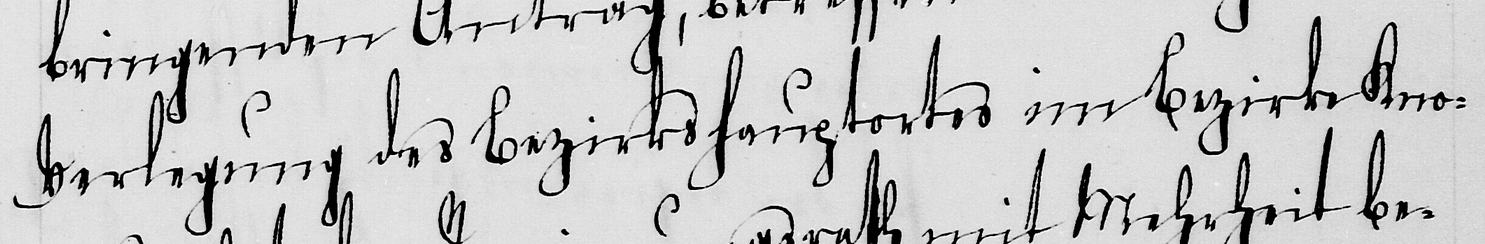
Verlegung des Bezirkshauptortes im Bezirke Kno¬
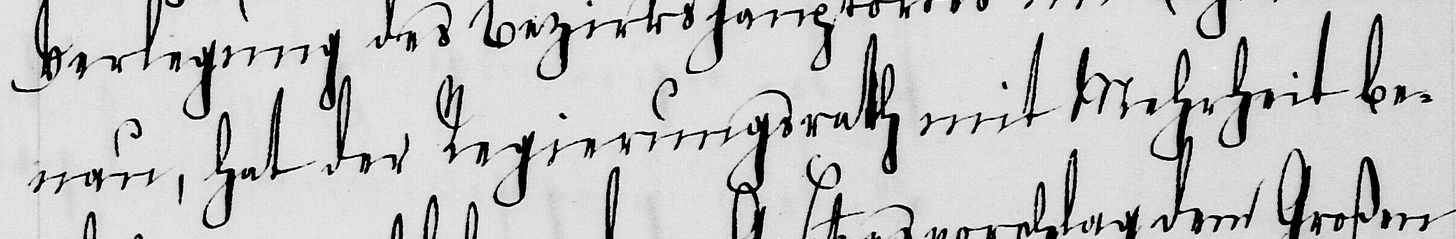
nau, hat der Regierungsrath mit Mehrheit be¬
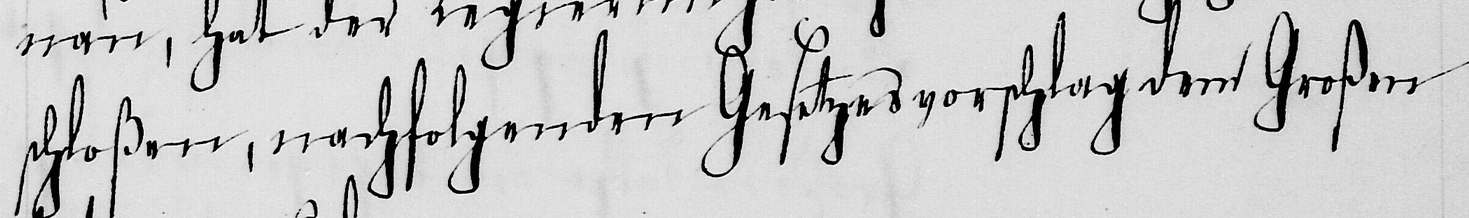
schloßen, nachfolgenden Gesetzesvorschlag dem Großen
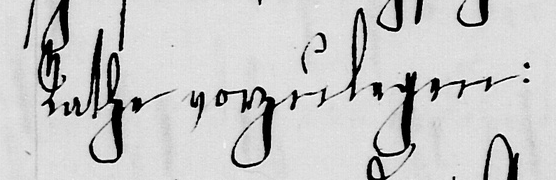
Rathe vorzulegen:
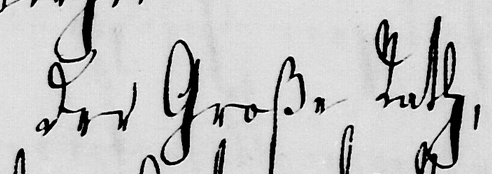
Der Große Rath,
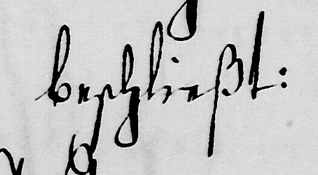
beschließt:
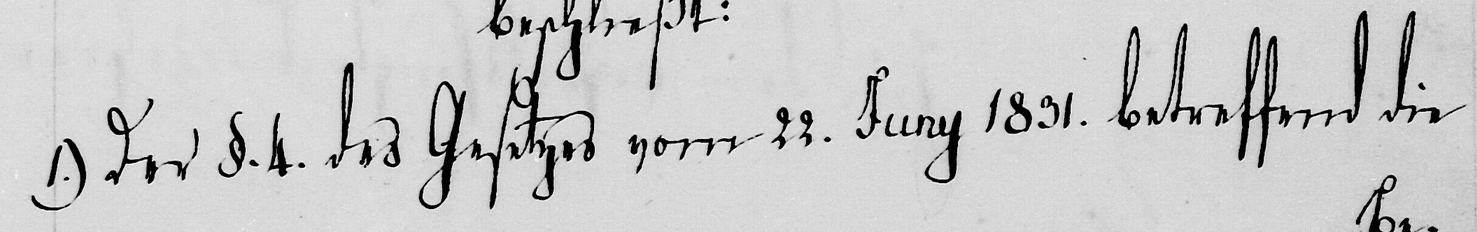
§. 4. des Gesetzes vom 22. Juny 1831. betreffend die
